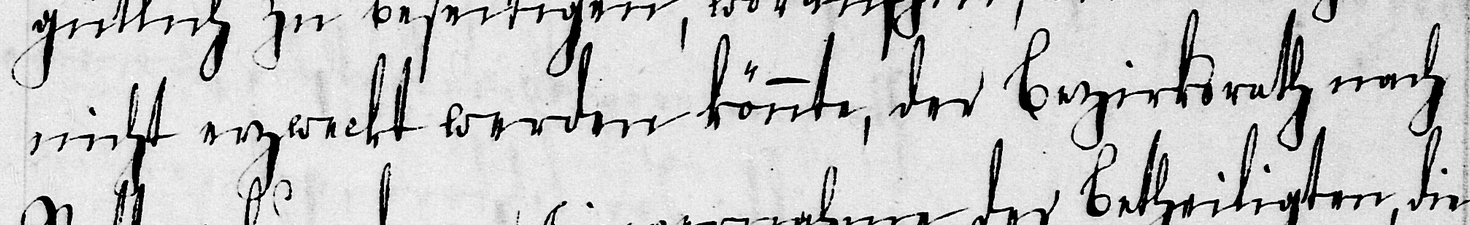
nicht erzweckt werden könnte, der Bezirksrath nach
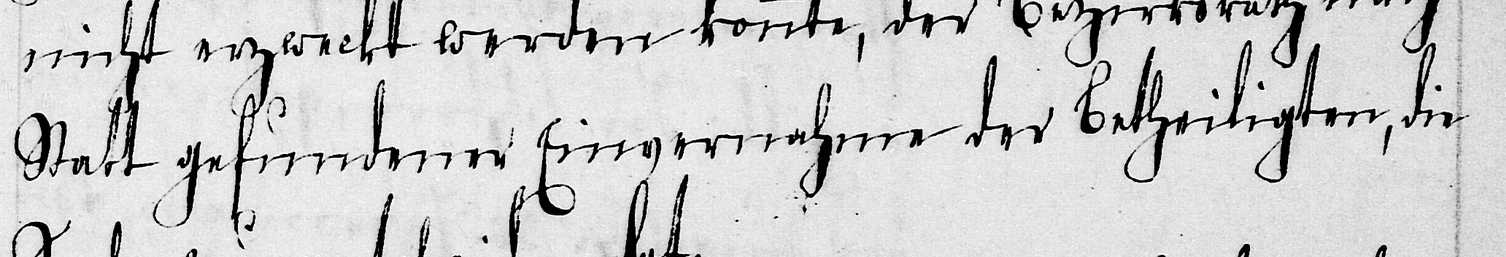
Statt gefundener Einvernahme der Betheiligten, die
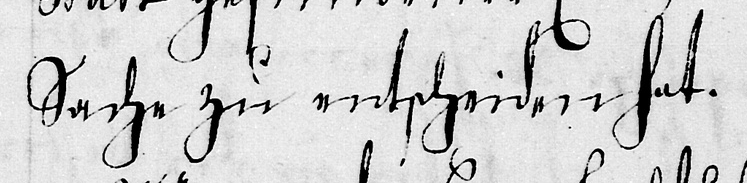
Sache zu entscheiden hat.
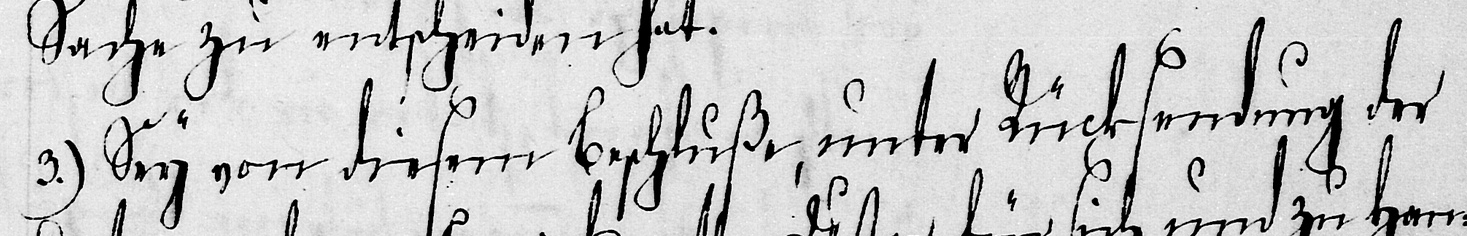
3.) Sey von diesem Beschluße, unter Rücksendung der
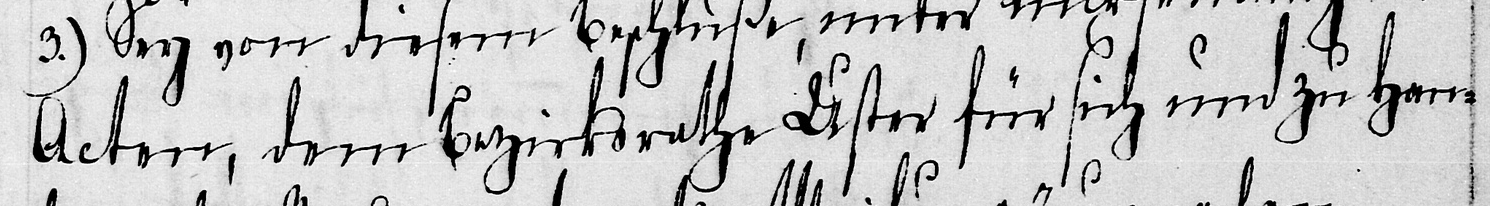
Acten, dem Bezirksrathe Uster für sich und zu Han¬
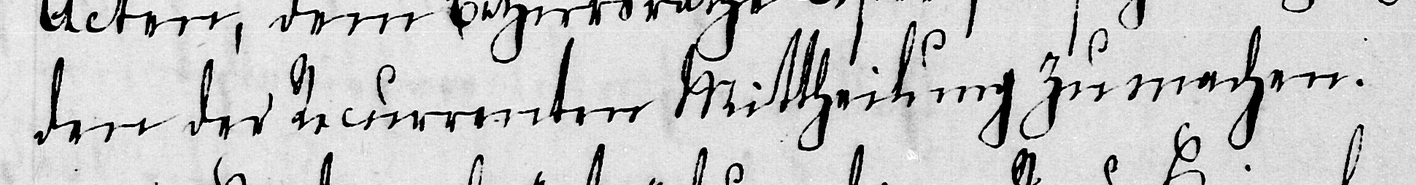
den der Recurrenten Mittheilung zu machen.
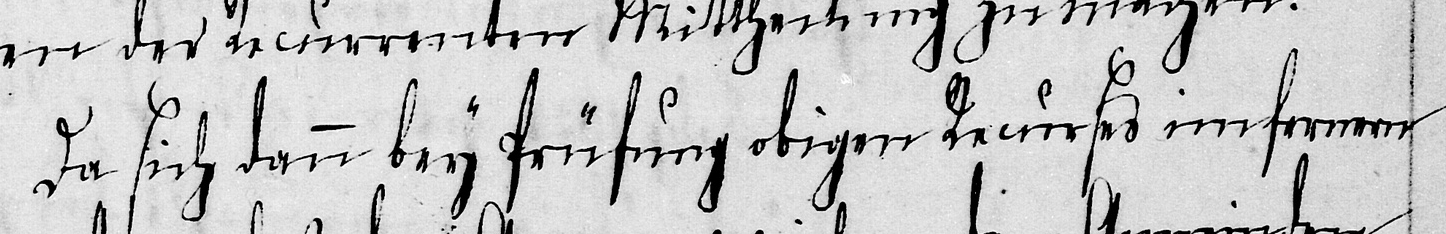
Da sich dann bey Prüfung obigen Recurses im fernern
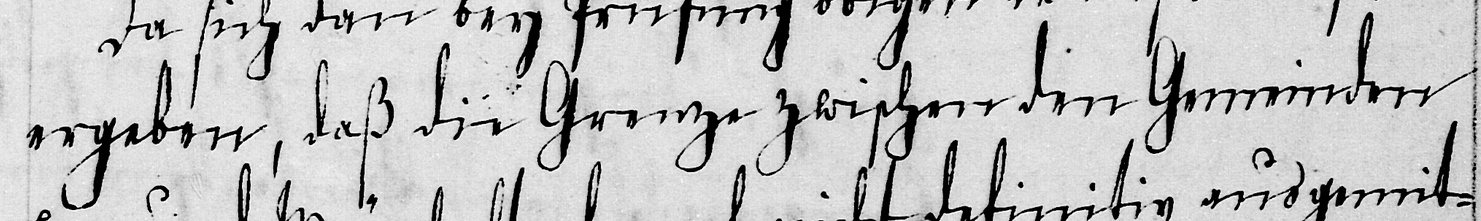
ergeben, daß die Grenze zwischen den Gemeinden
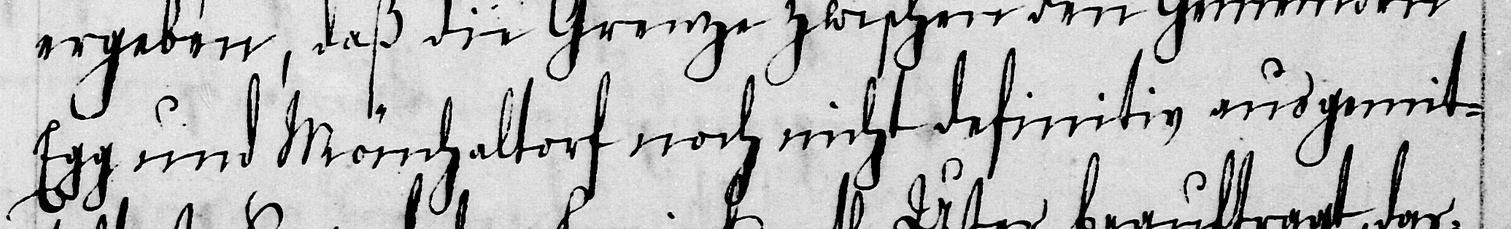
Egg und Mönchaltorf noch nicht definitiv ausgemit¬
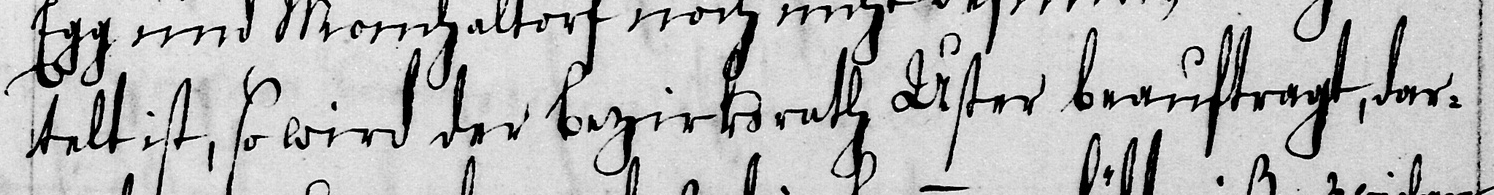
telt ist, so wird der Bezirksrath Uster beauftragt, dar¬
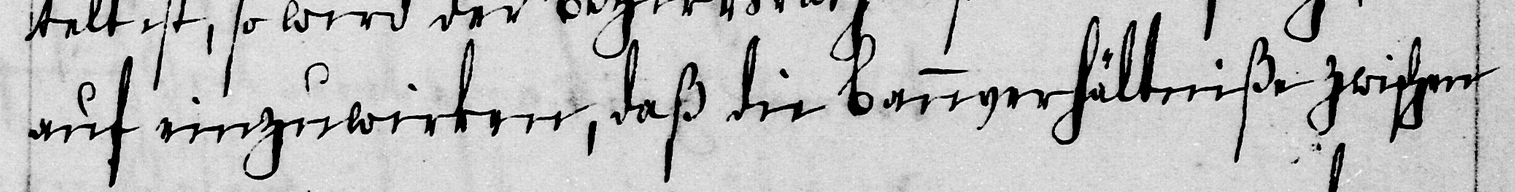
auf einzuwirken, daß die Bannverhältniße zwischen
